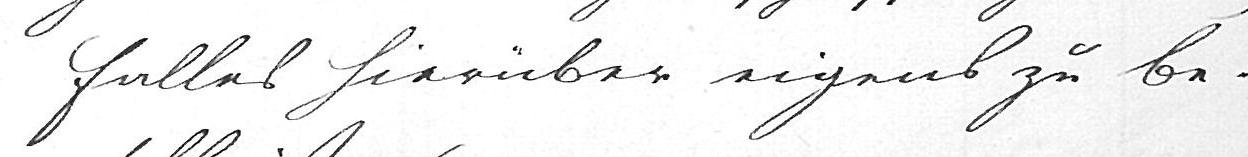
Falles hierüber eigens zu be-
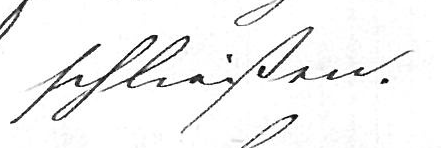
schließen.
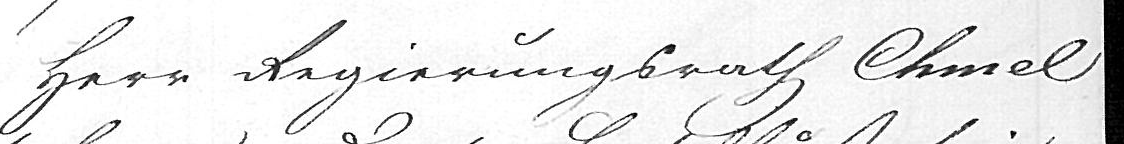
Herr Regierungsrath Chmel
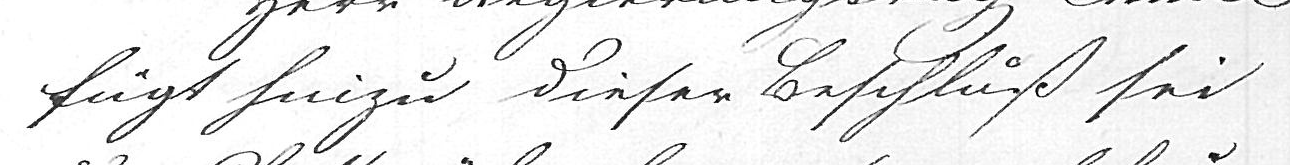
fügt hinzu dieser Beschluß sei
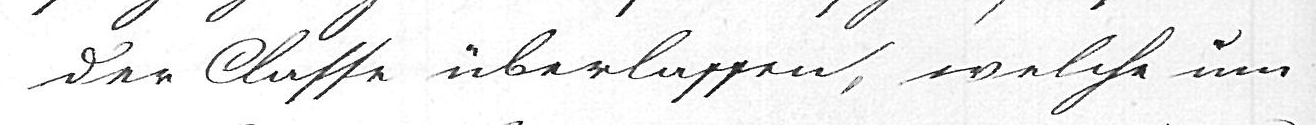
der Classe überlassen, welche um
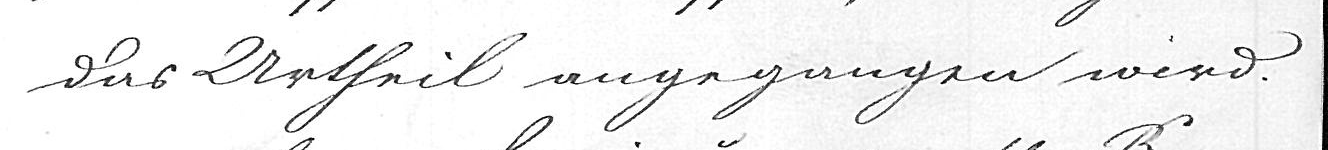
das Urtheil angegangen wird.
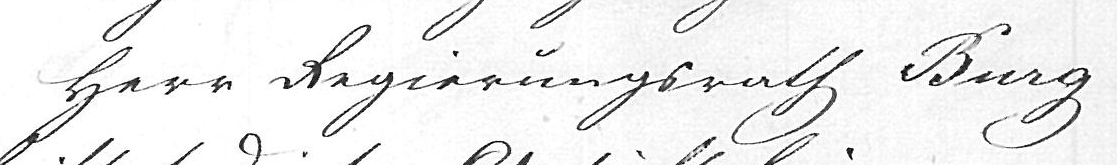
Herr Regierungsrath Burg
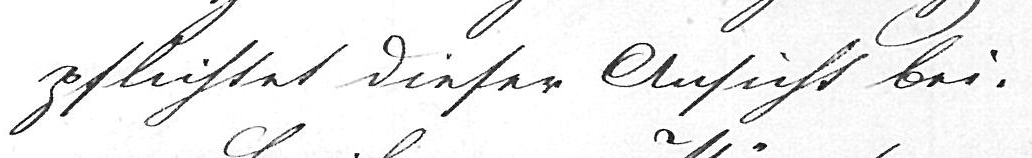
pflichtet dieser Ansicht bei.
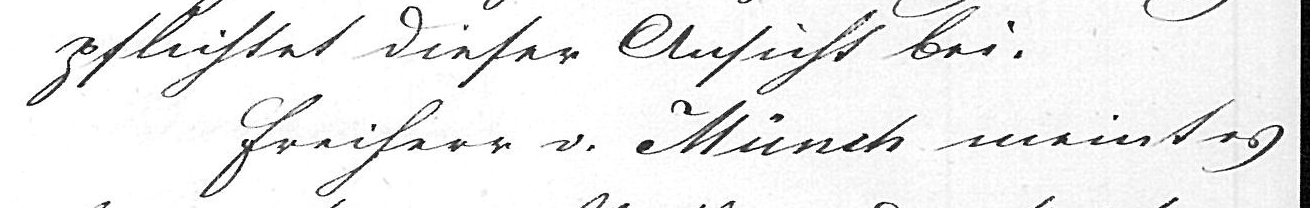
Freiherr v. Münch meint es
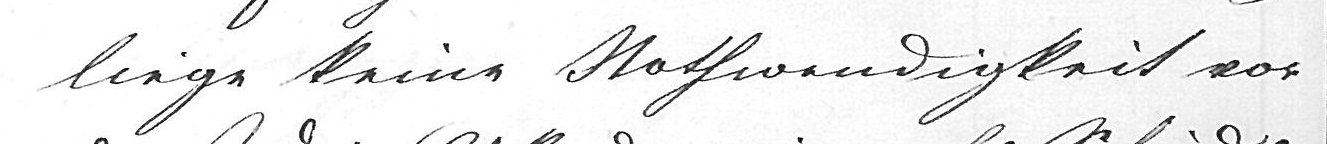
liege keine Nothwendigkeit vor
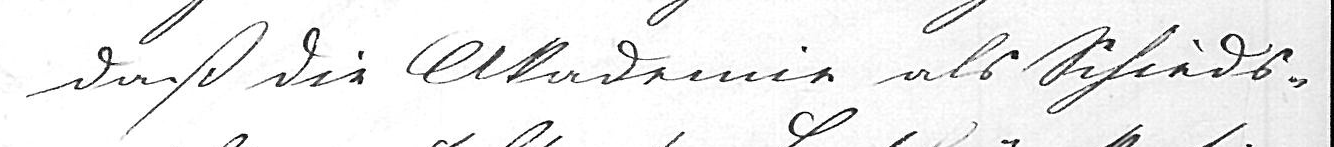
daß die Akademie als Schieds-
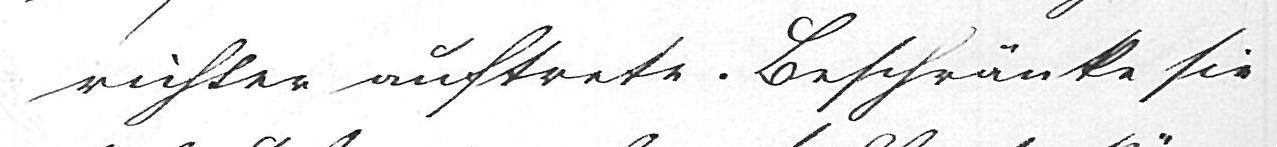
richter auftrete. Beschränke sie
